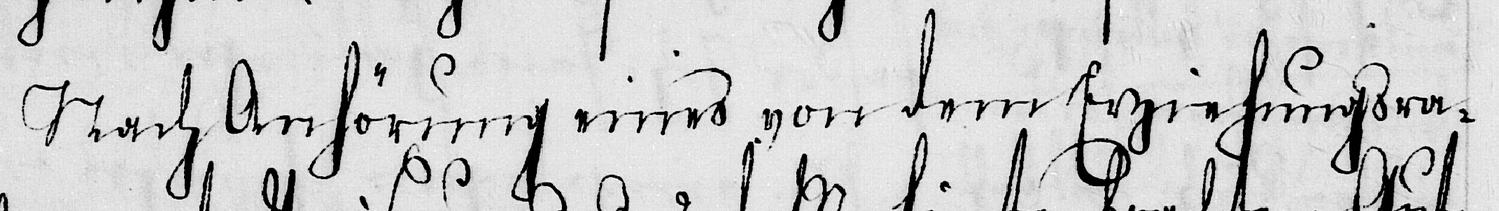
Nach Anhörung eines von dem Erziehungsra¬
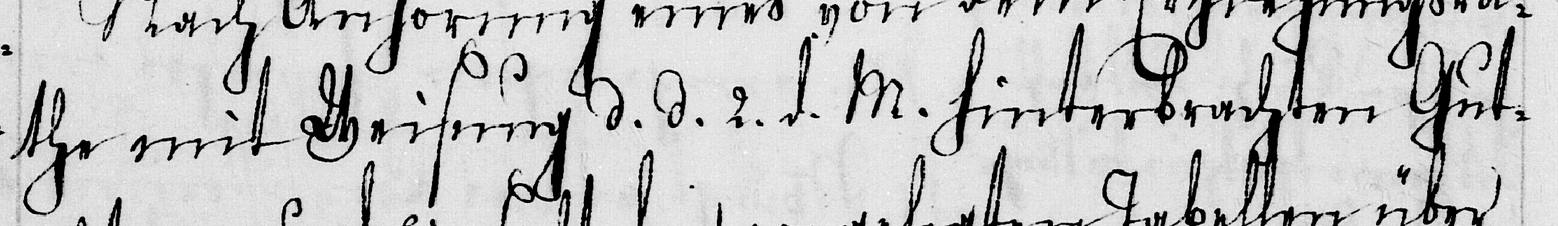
the mit Weisung d. d. 2. d. M. hinterbrachten Gut¬
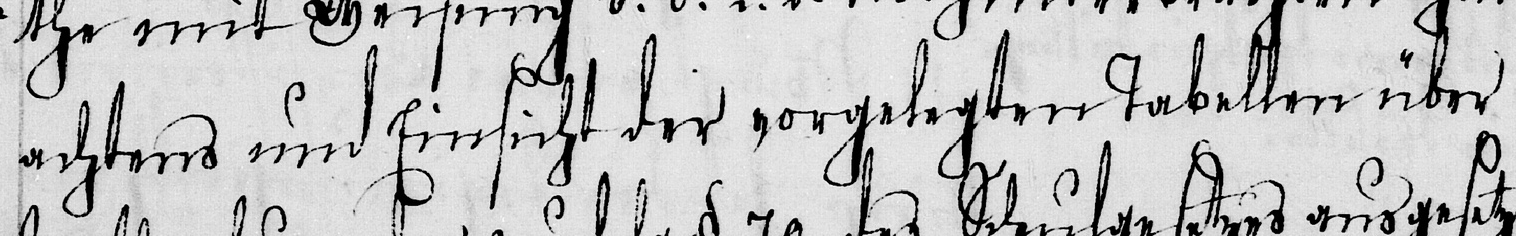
achtens und Einsicht der vorgelegten Tabellen über
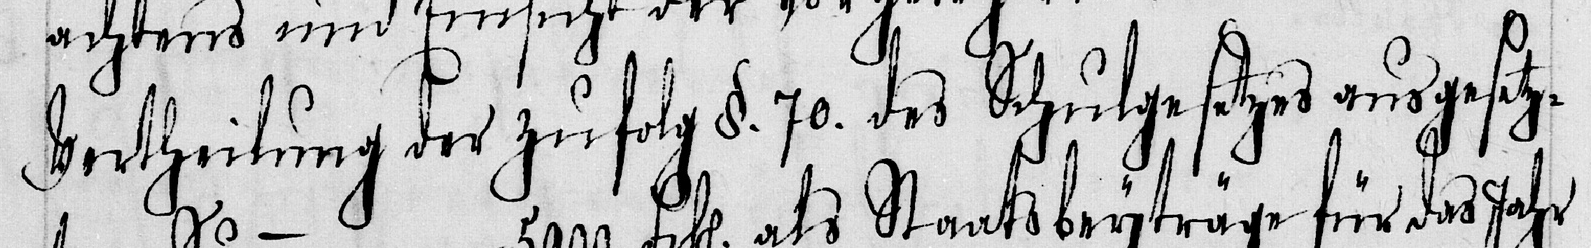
Vertheilung der zu folg §. 70. des Schulgesetzes ausgeset¬
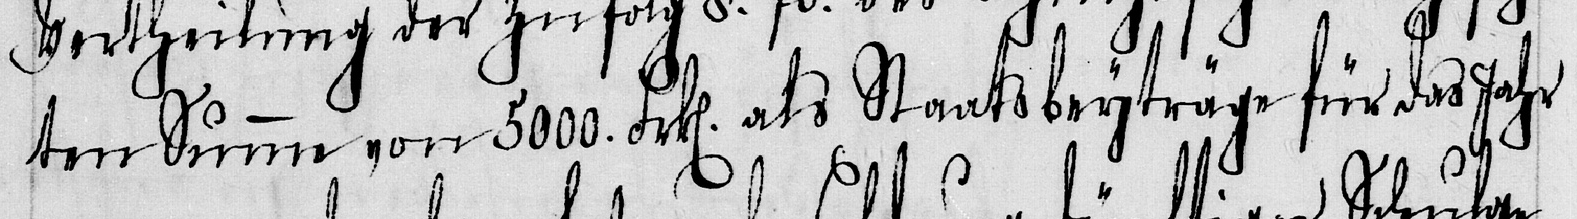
zten Summe von 5000. Frk[en] als Staatsbeyträge für das Jahr
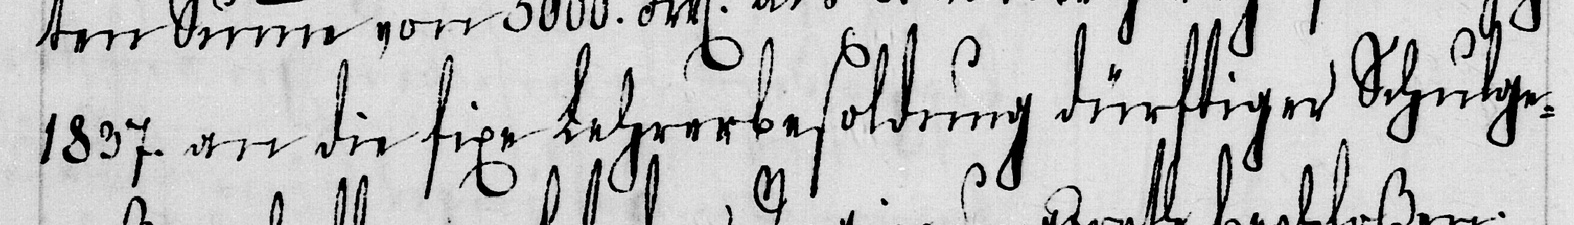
1837. an die fixe Lehrerbesoldung dürftiger Schulge¬
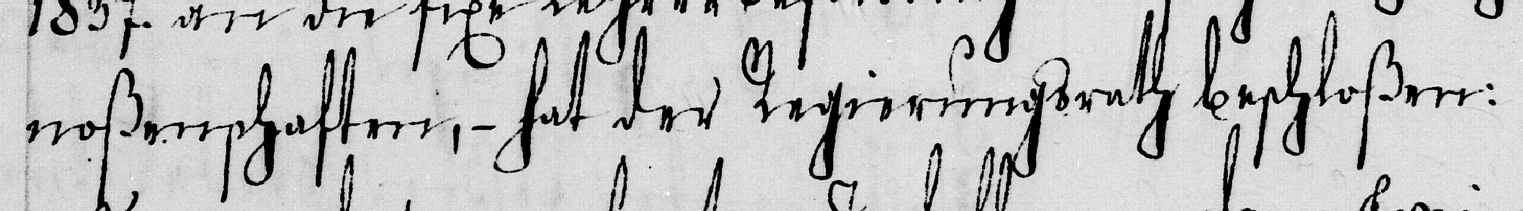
noßenschaften, – hat der Regierungsrath beschloßen:
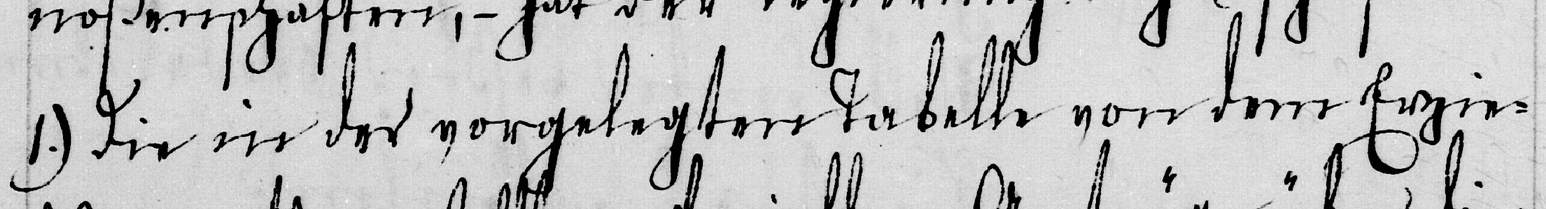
1.) Die in der vorgelegten Tabelle von dem Erzie¬
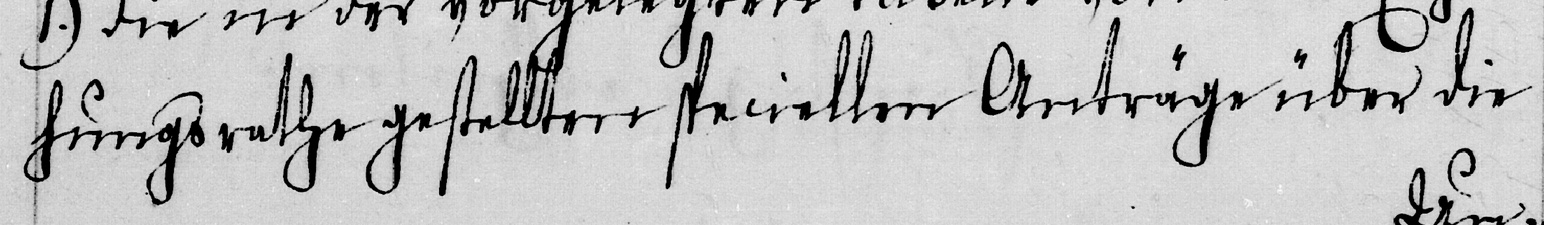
hungsrathe gestellten speciellen Anträge über die
